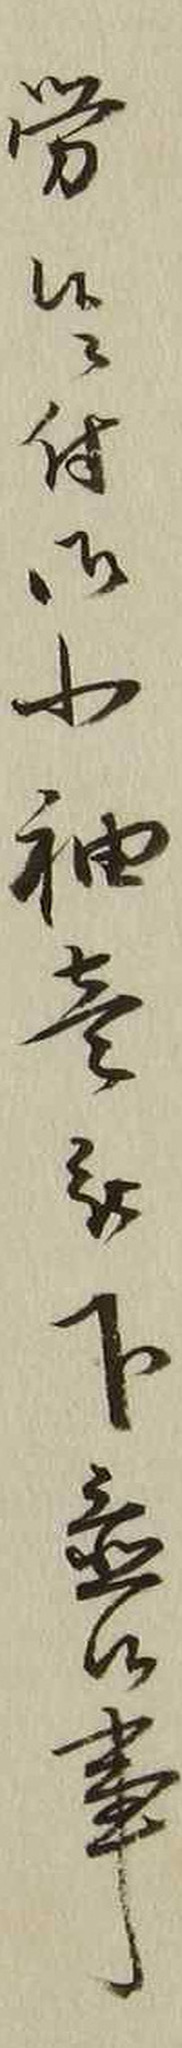労候に付御小袖壱被下置候事
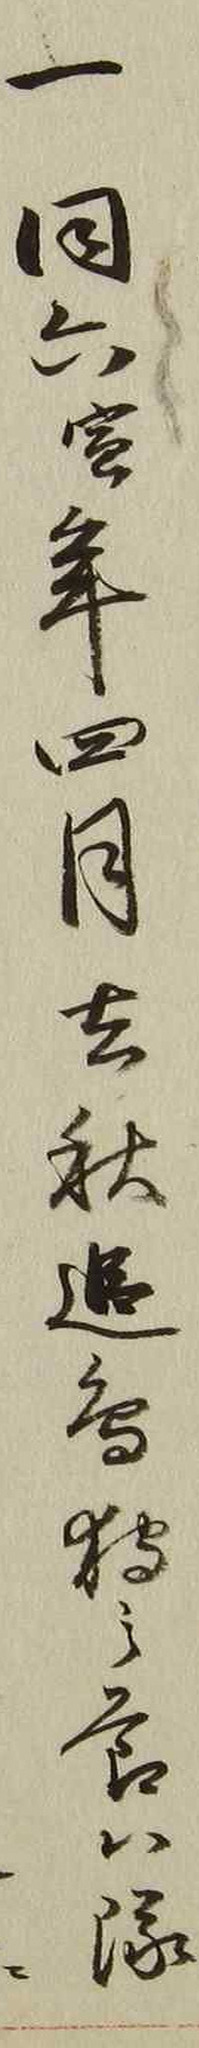一同六寅年四月去昭秋追鳥狩之節は隊
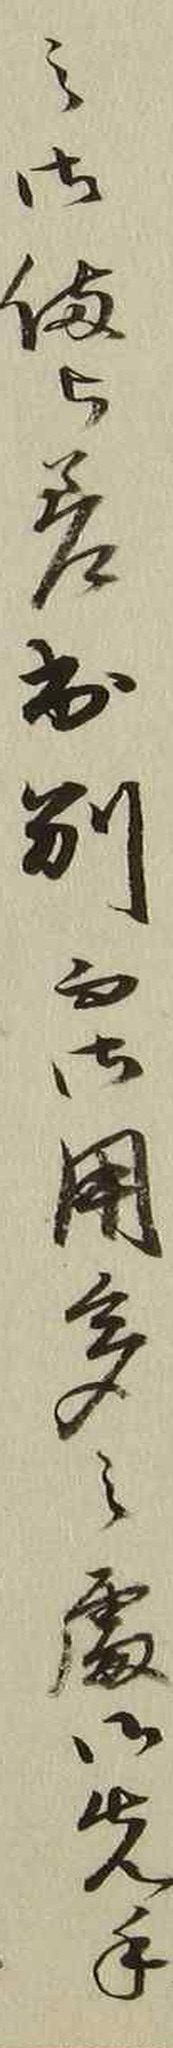之御備被差出別而御用多之処御先手に
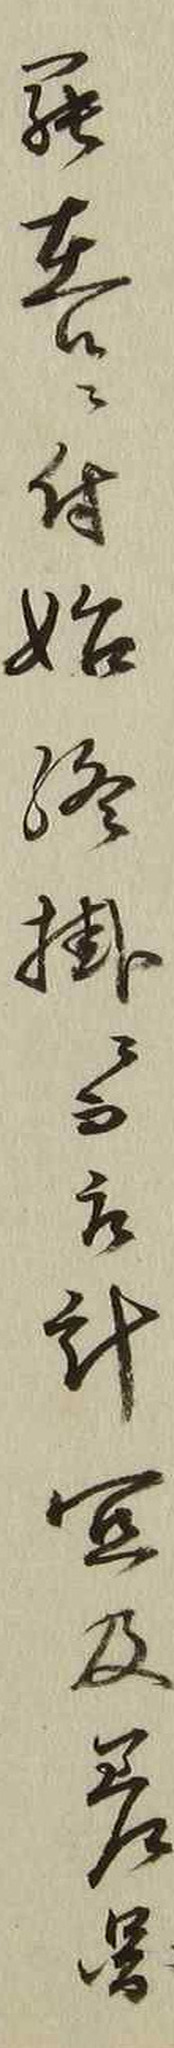罷在候に付始終掛に而取計宜及指図
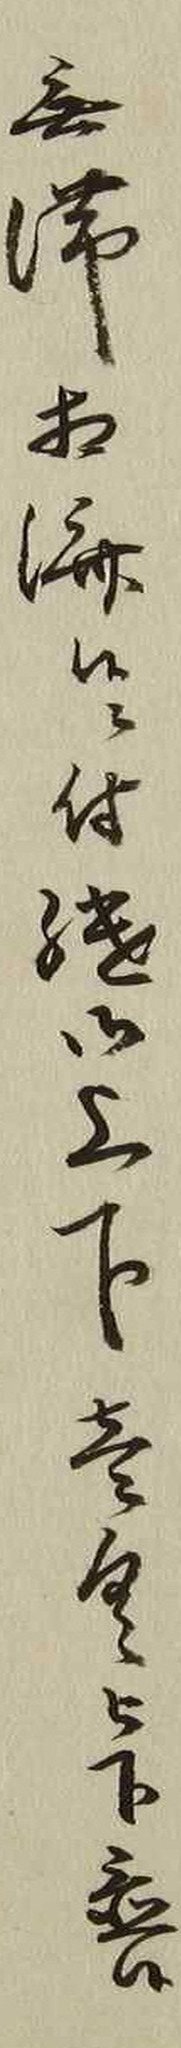無滞相済候に付継御上下壱具被下置候
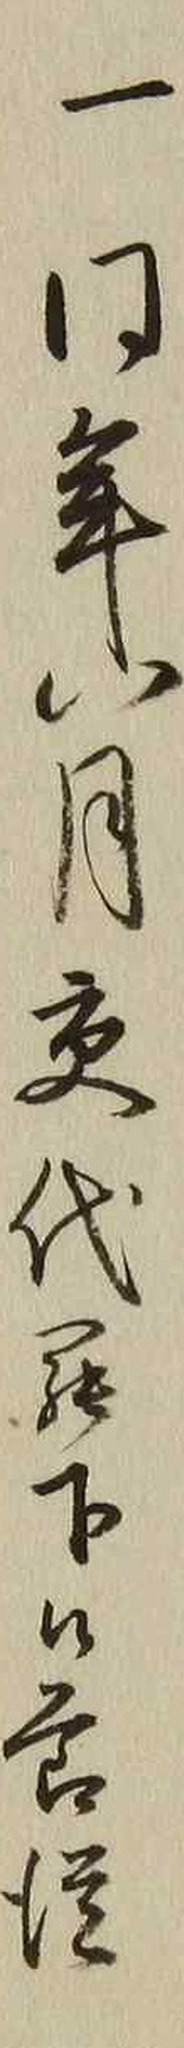一同年八月交代罷下候節従
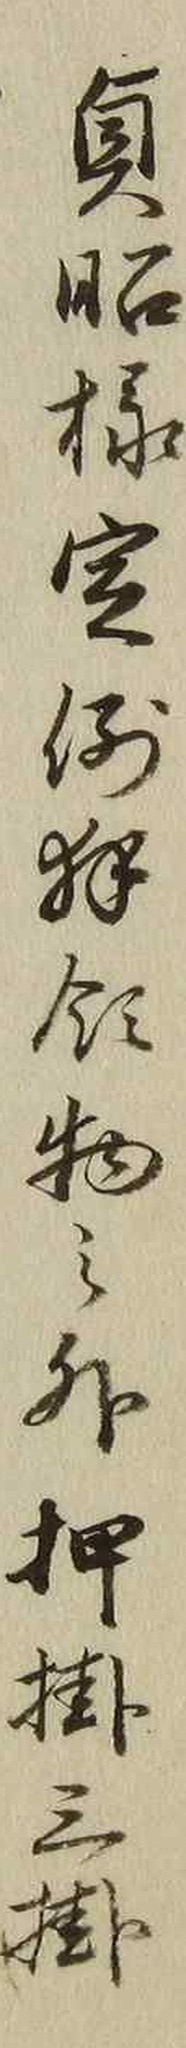貞昭様定例拝領物之外押掛三掛
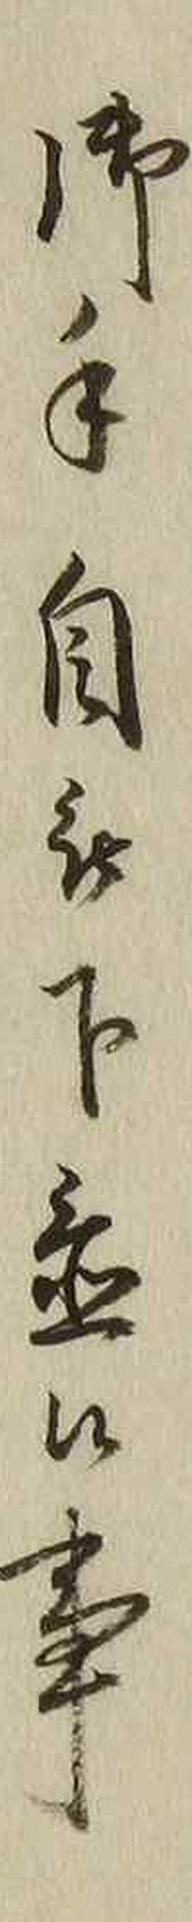御手自被下置候事
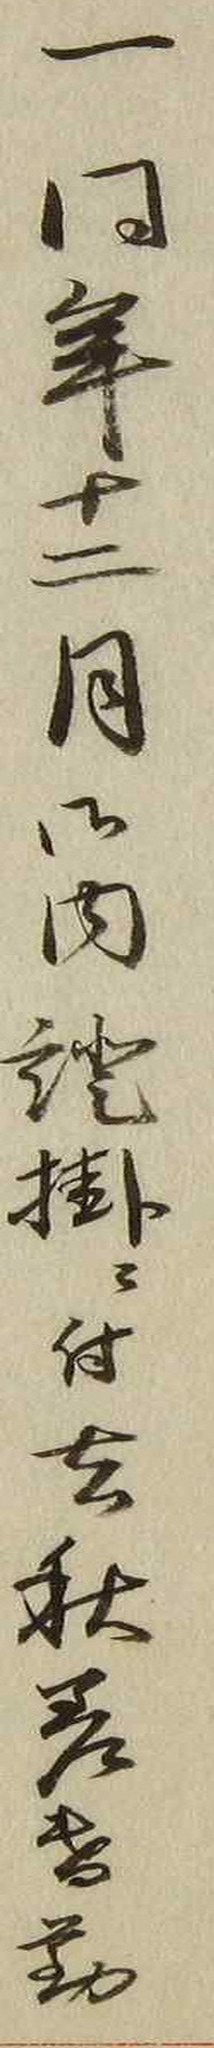一同年十二月御内証掛に付去秋差遣勤
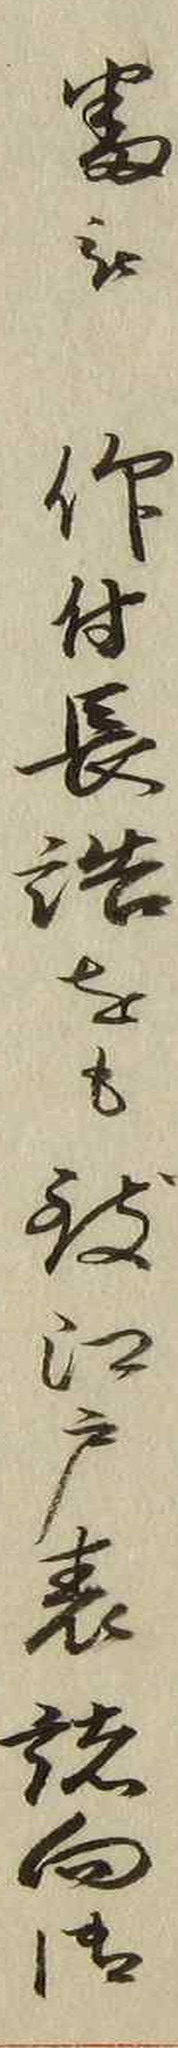番被仰付長詰をも致江戸表諸向御
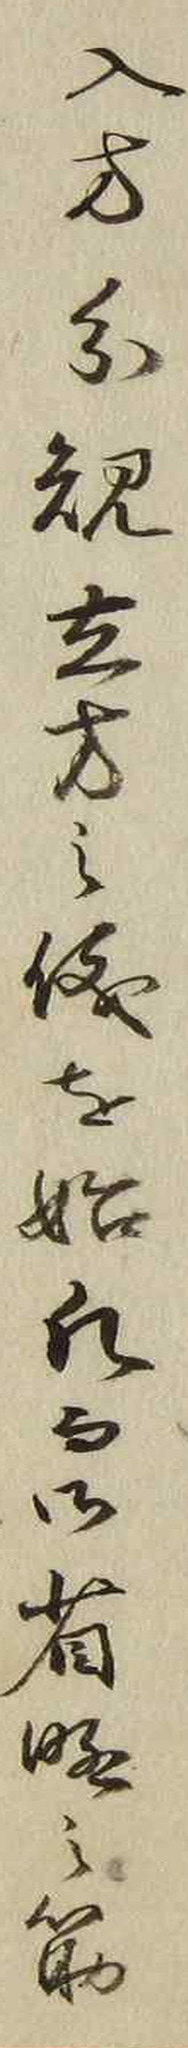入方分規立方之儀を始凡而御省略之筋
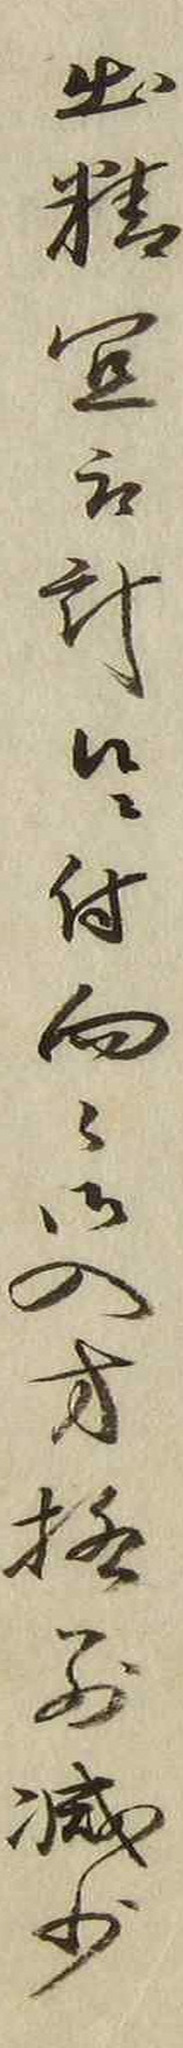出精宜取計候に付向々御入方格別減少
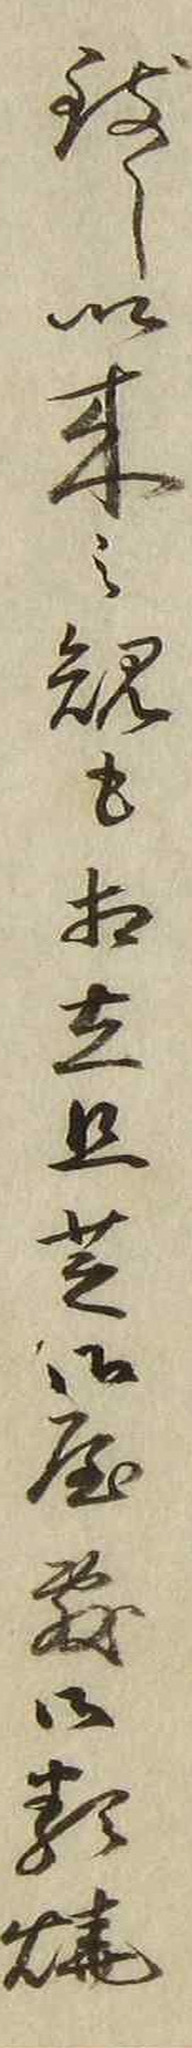致し以来之規も相立且芝御屋敷御類焼
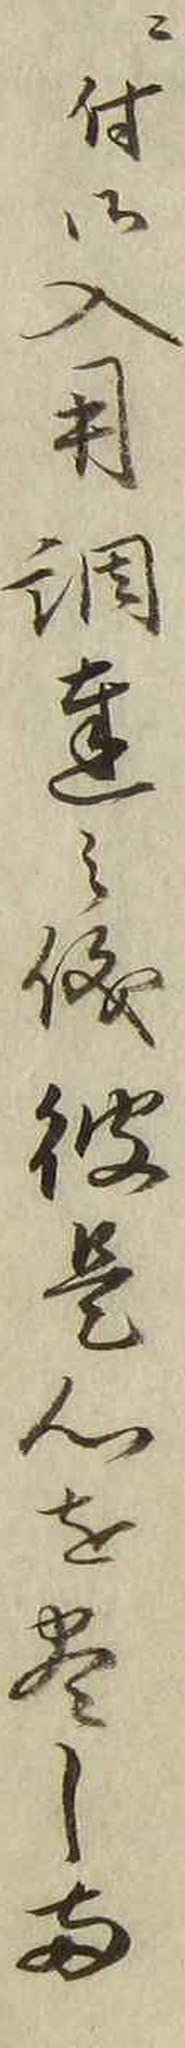に付入用調達之儀彼是心を尽し両

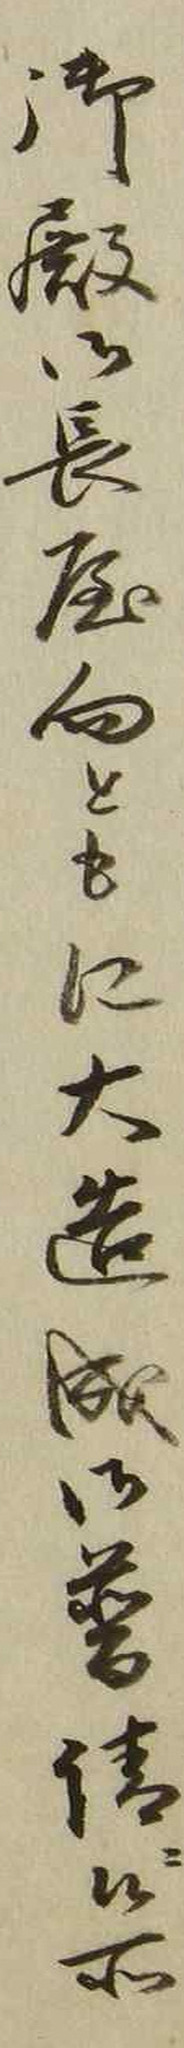御殿御長屋向ともに大造成御普請に候所
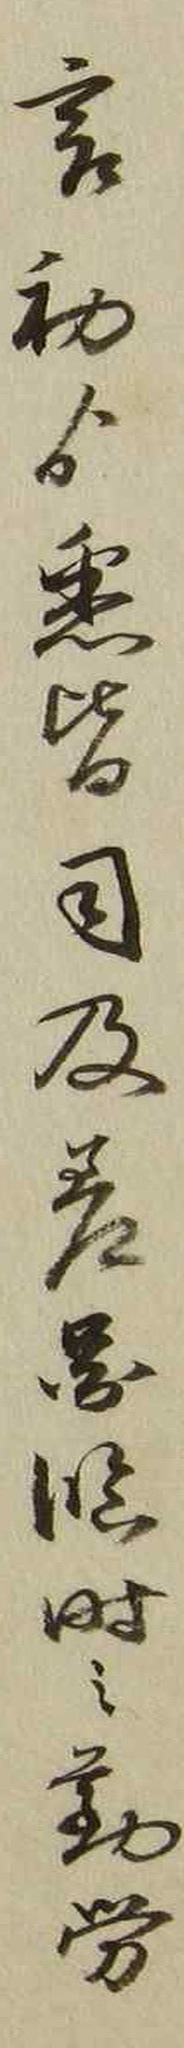最初ゟ悉皆司及指図臨時之勤労
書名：諸士系譜　巻之125　た之部1
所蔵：会津若松市立会津図書館
